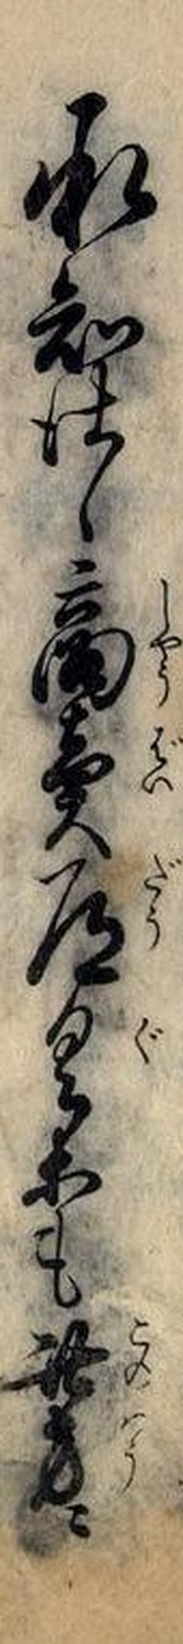承知仕候商売道具等も此方に
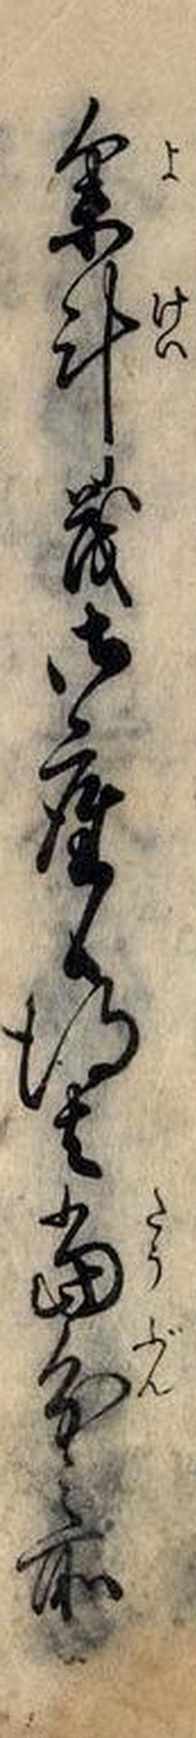余計も御座候得者當分之所
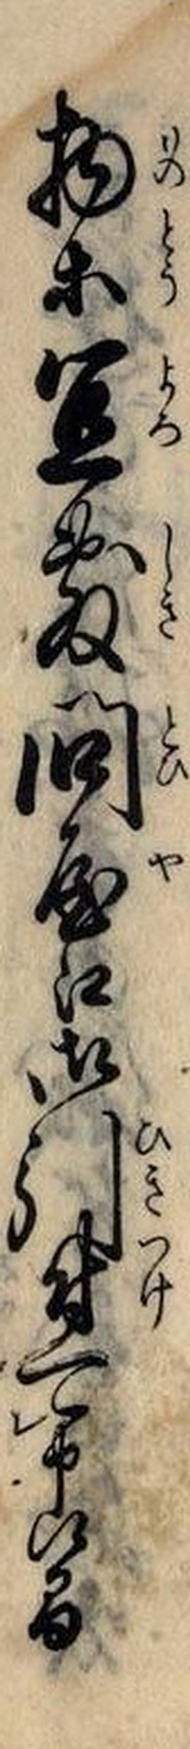物等宜敷問屋江御引付可申候間
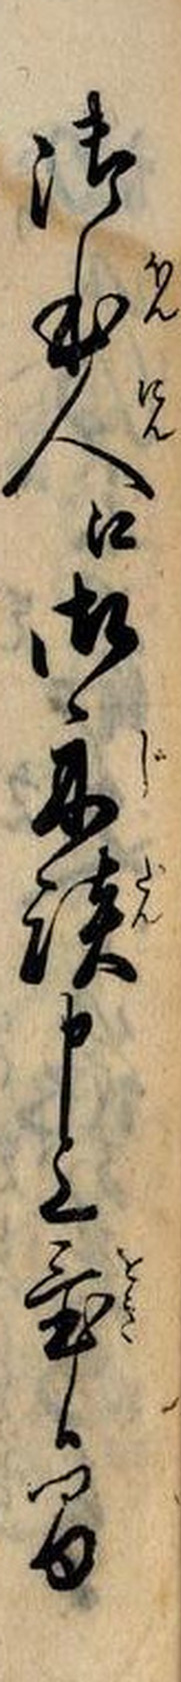御本人江御示談申上置候間
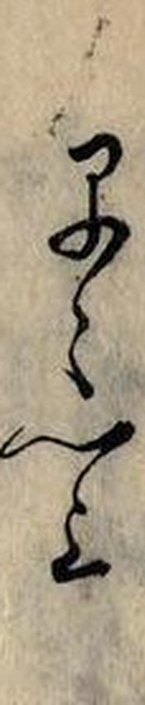早々以上
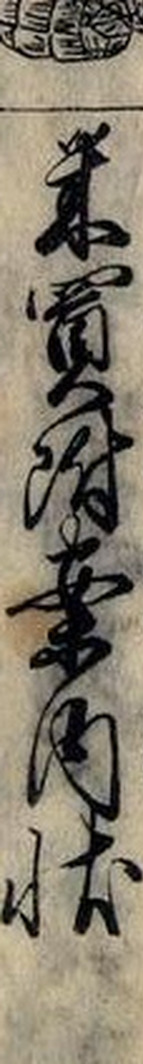米買附案内状
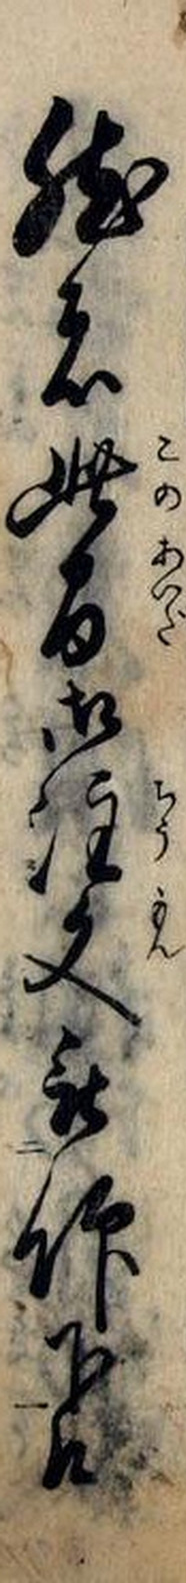然者此間御注文被仰下候

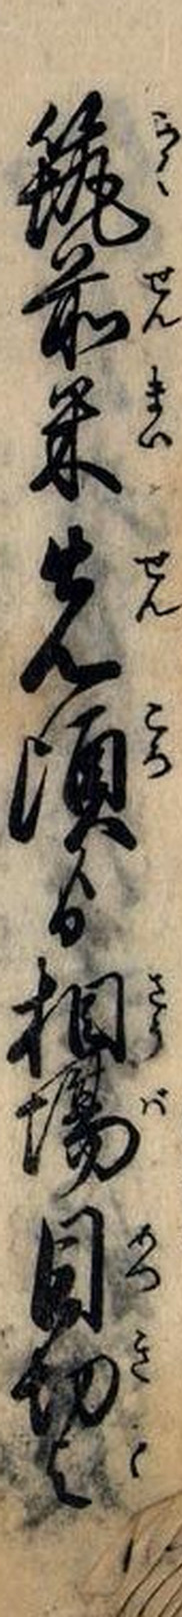筑前米先頃ゟ相場目切与
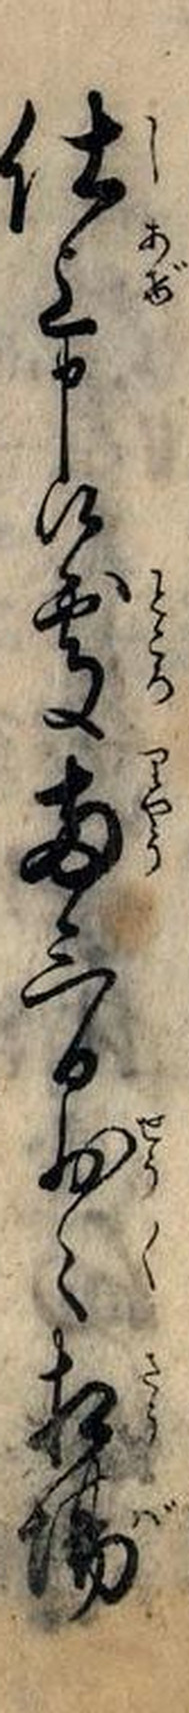仕上申候處両三日少々相場
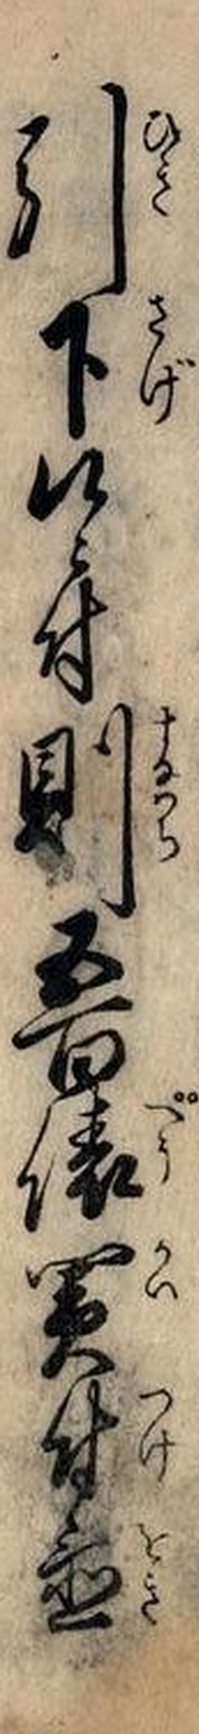引下候に付則五百俵買付置
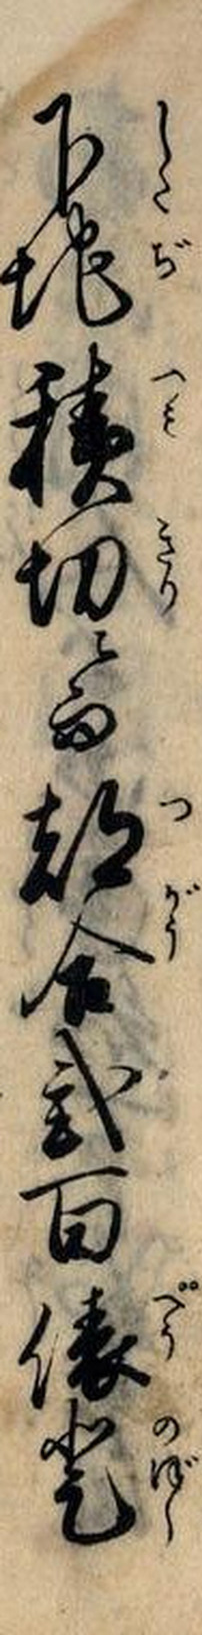下地積切に而都合弐百俵登
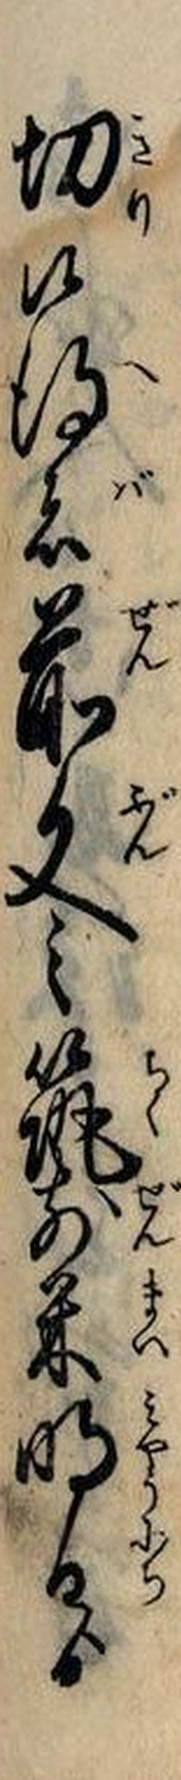切候得者前文之筑前米明日ゟ
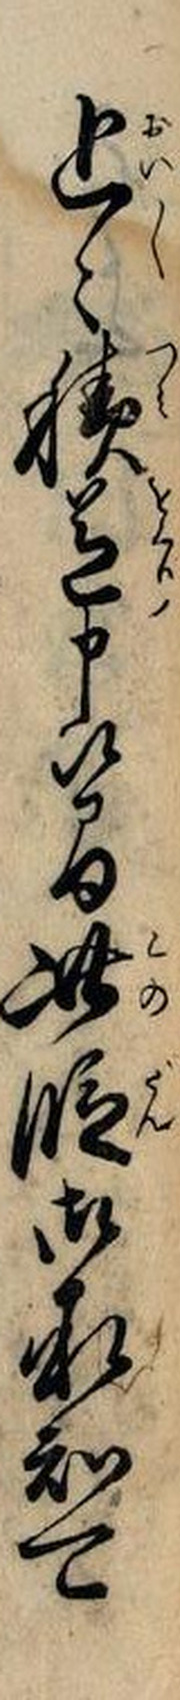追々積送申候間此段御承知可
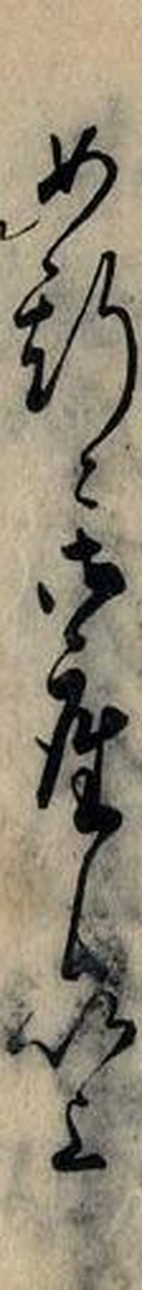如斯に御座候以上
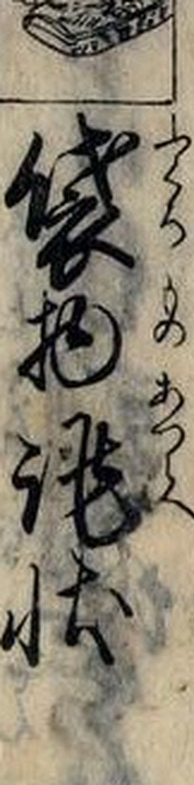袋物誂状
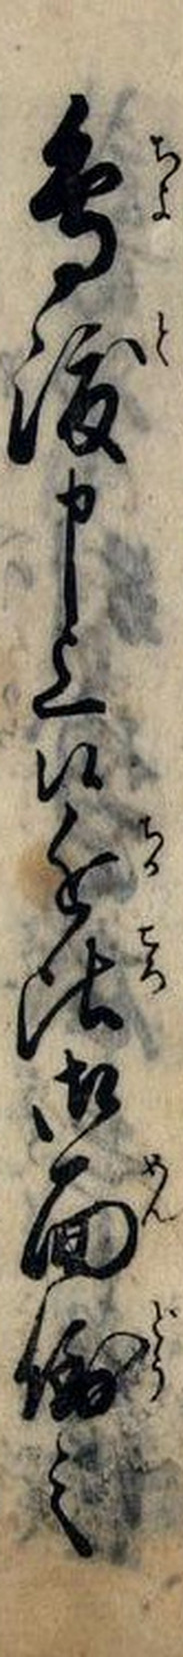鳥渡申上候近頃御面倒之
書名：大成用文章（往来物）
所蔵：福井県文書館 Fukui Prefectural Archives
